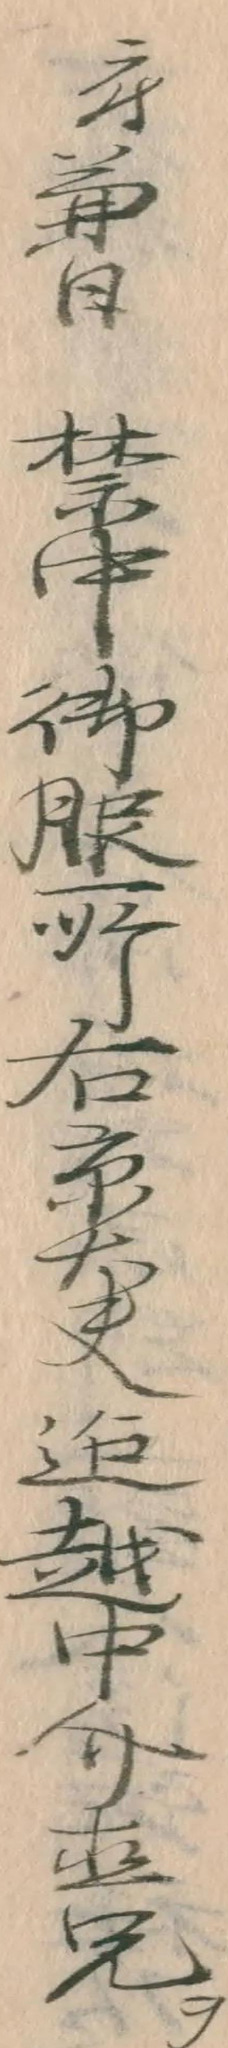二付兼日禁中御服所右京大夫迄越中介直兄ヲ
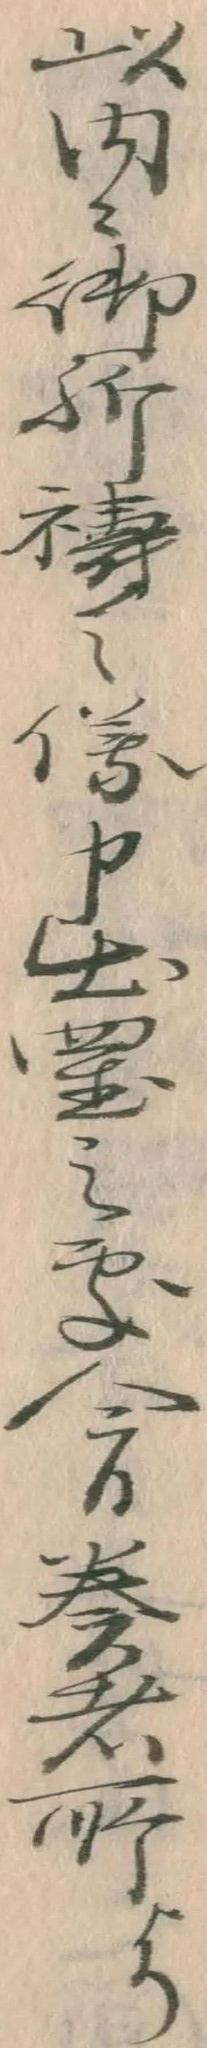以内々御祈祷之儀申出置之處今日奏者所より
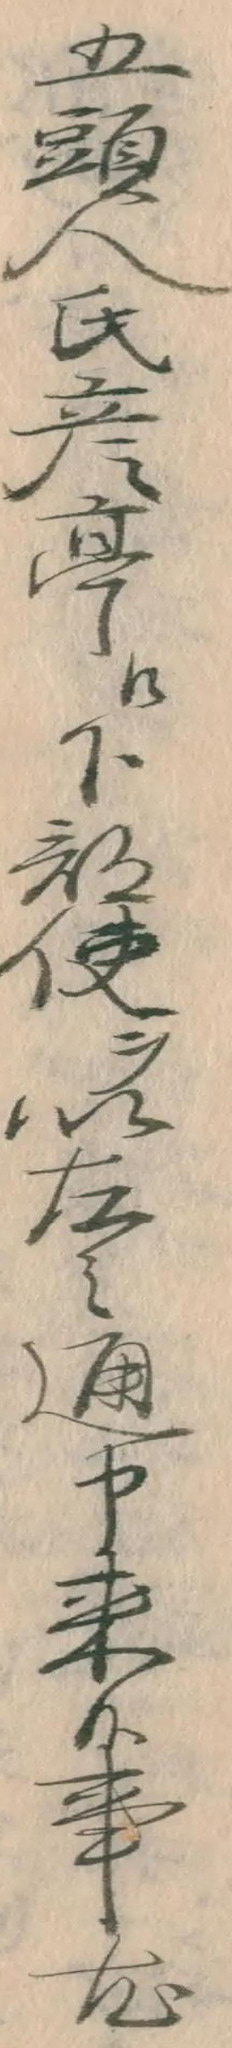五頭人氏彦亭え下部使ヲ以左之通申来候事尤
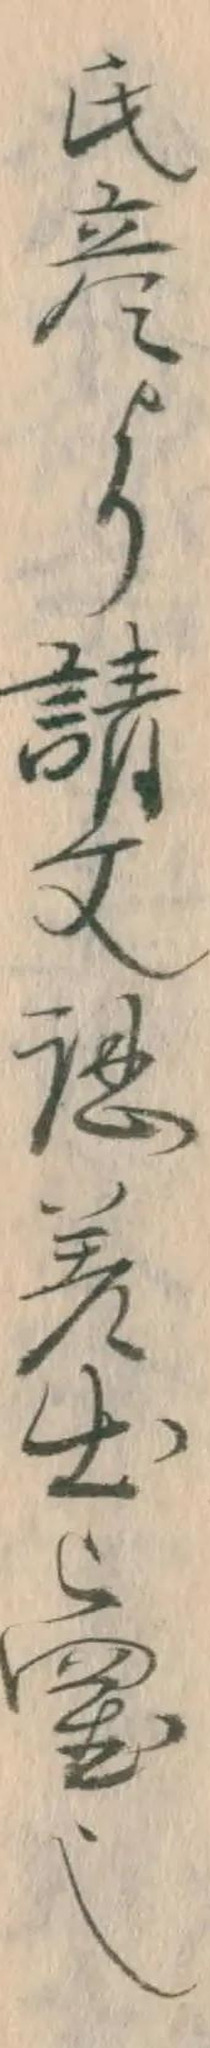氏彦より請文認差出被置也
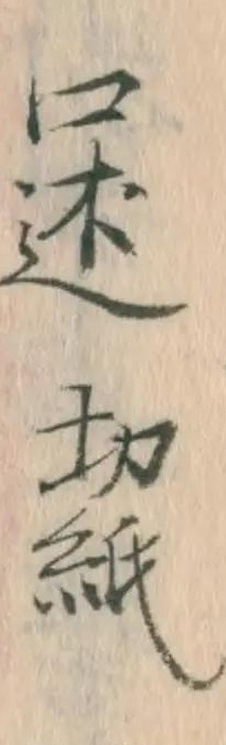口述切紙
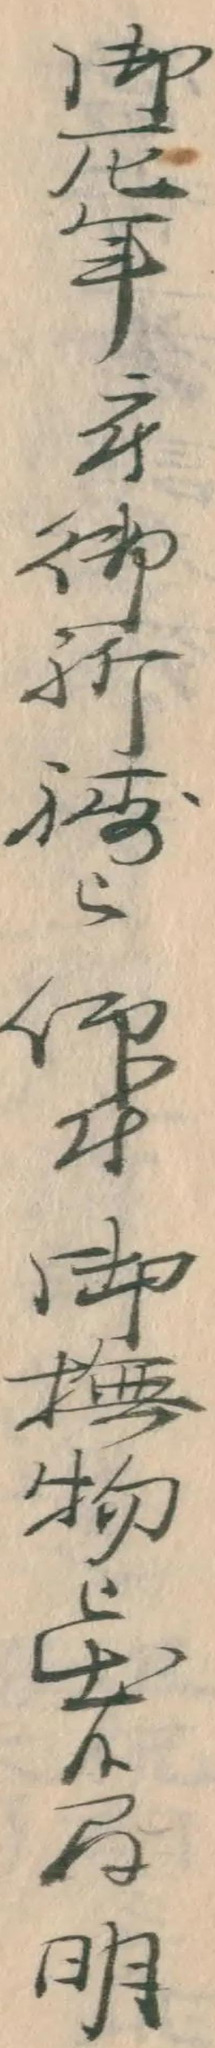御厄年ニ付御祈祷被仰付御撫物被出候間明
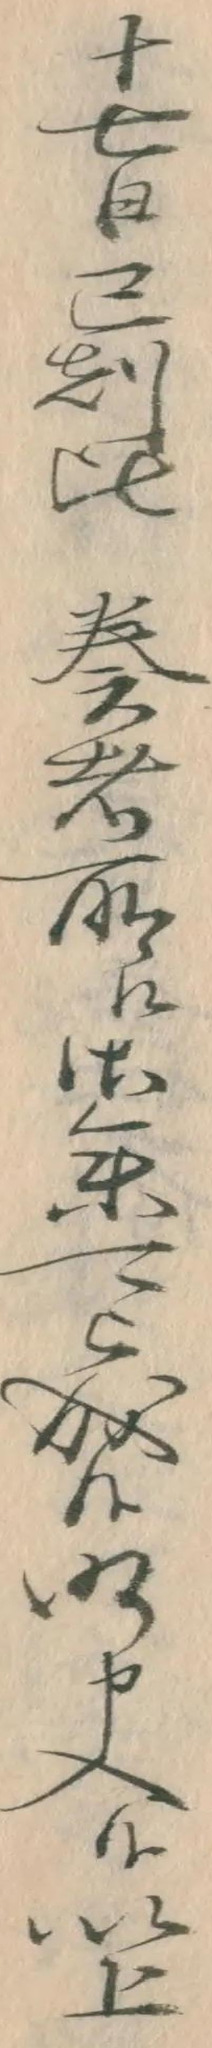十七日巳刻比奏者所え御参可被成候昨日申入候以上

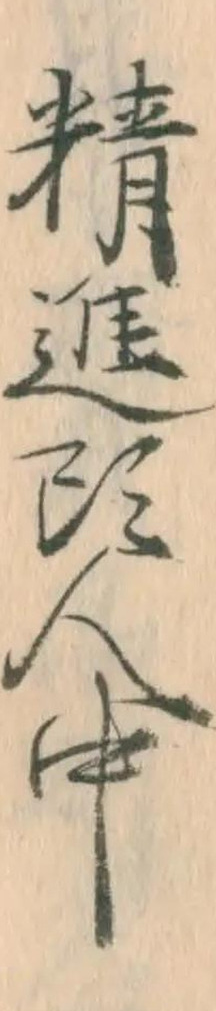精進頭人中
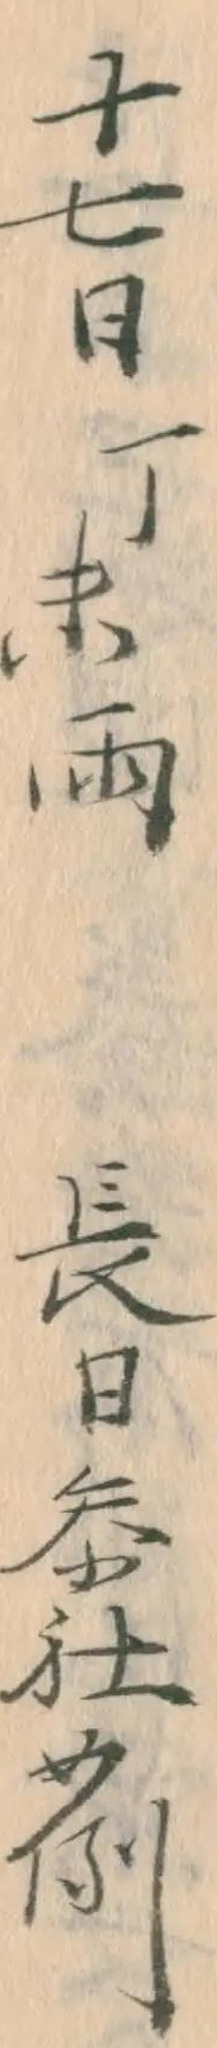十七日丁未雨長日参社如例
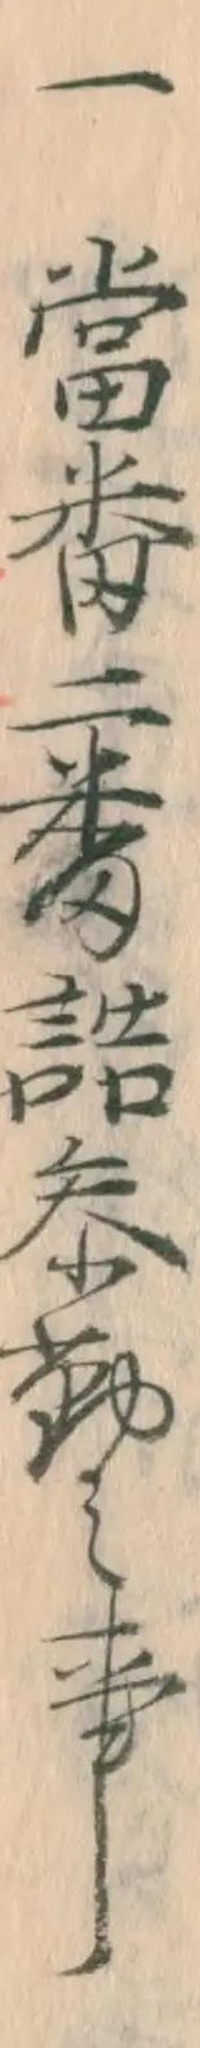一當番二番詰参勤之事
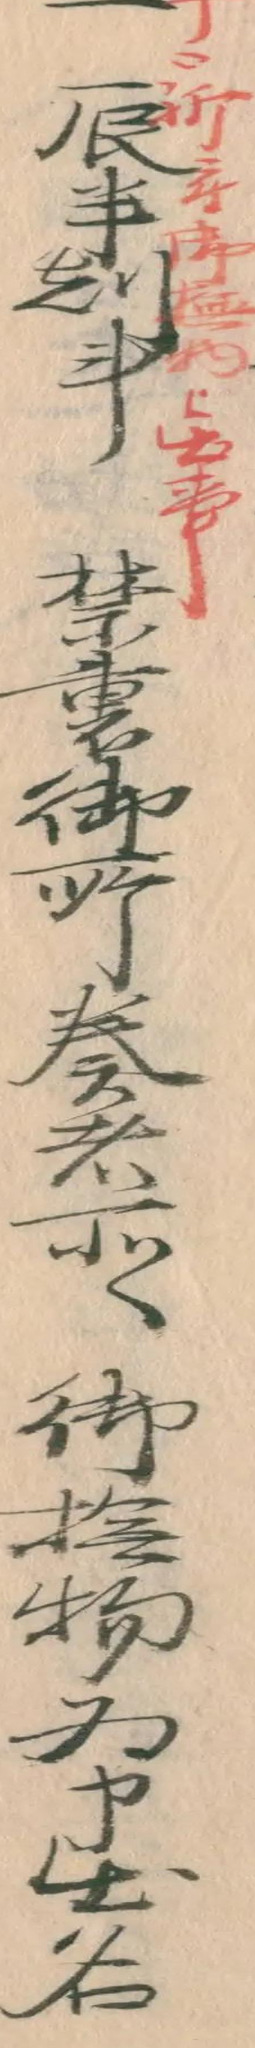一辰半刻斗禁裏御所奏者所へ御撫物為申出名
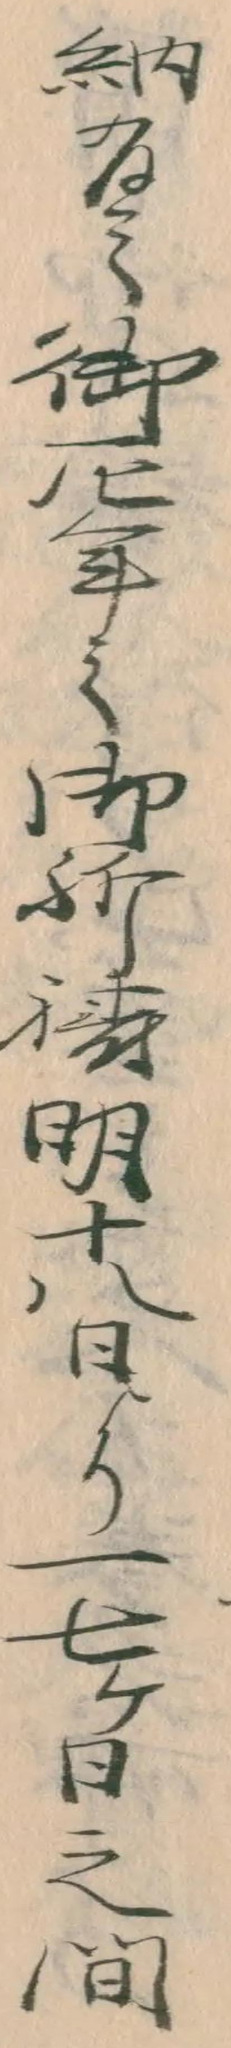納有之御厄年之御祈祷明十八日より一七ケ日之間
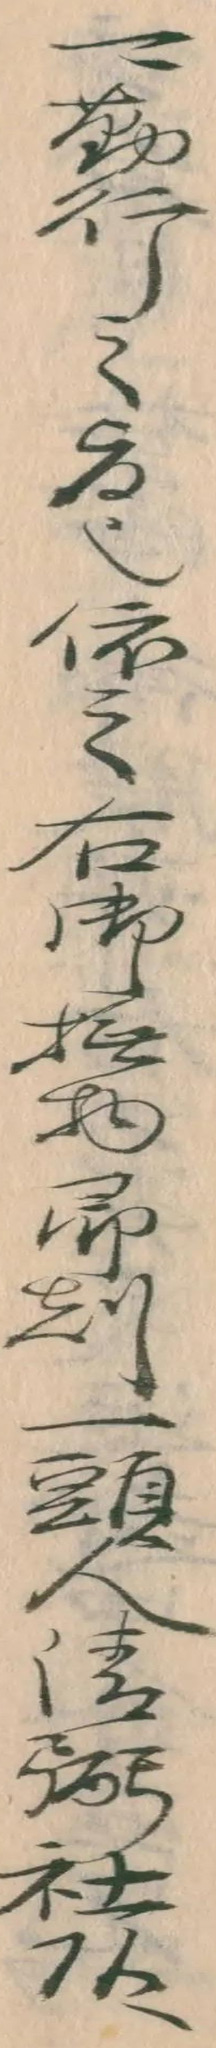可勤行之旨也依之右御撫物即刻一頭人清弼社頭へ
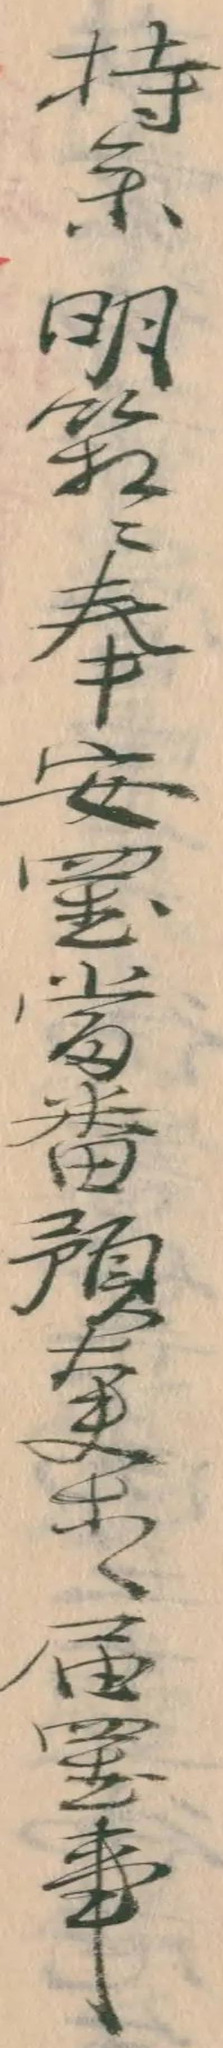持参明箱ニ奉安置當番預大夫等へ届置事
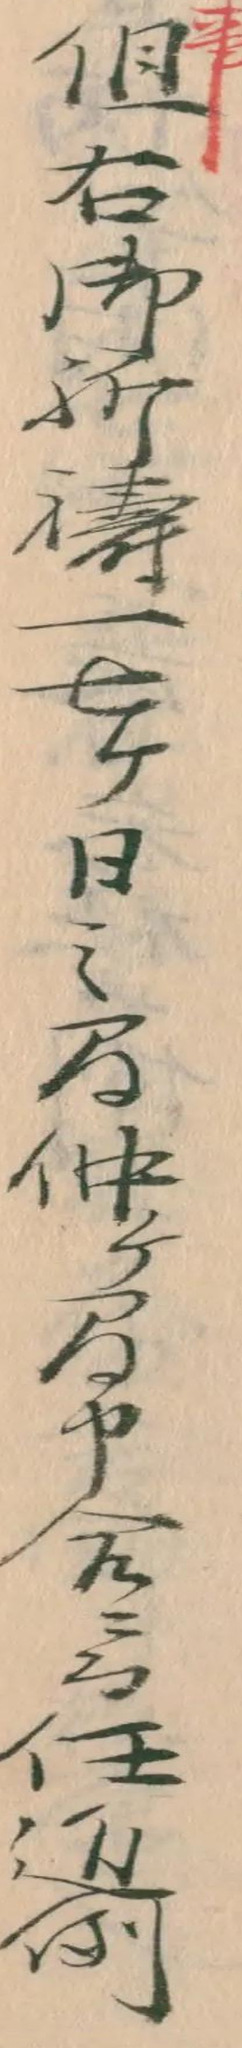但右御祈祷一七ヶ日之間仲ヶ間申合ニ而任近例
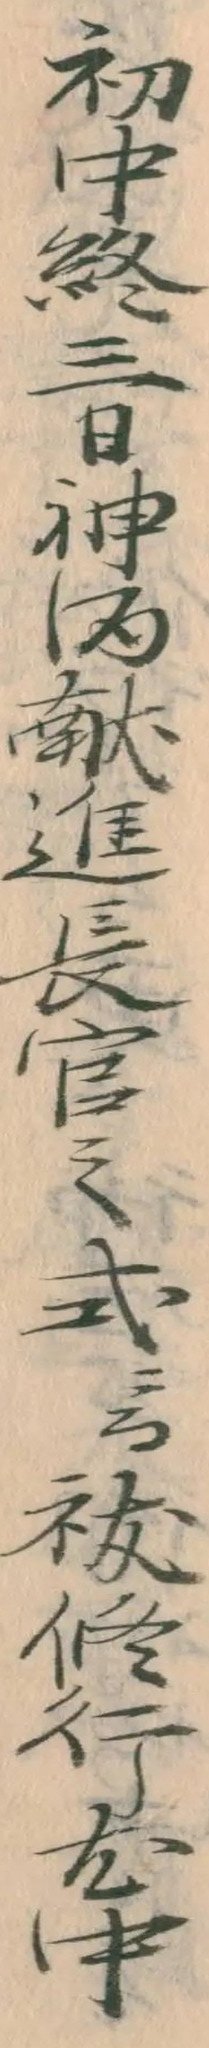初中終三日神酒献進長官之式ニ而祓修行尤中
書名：賀茂社記録. 第73冊
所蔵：国立国会図書館 National Diet Library, JAPAN
